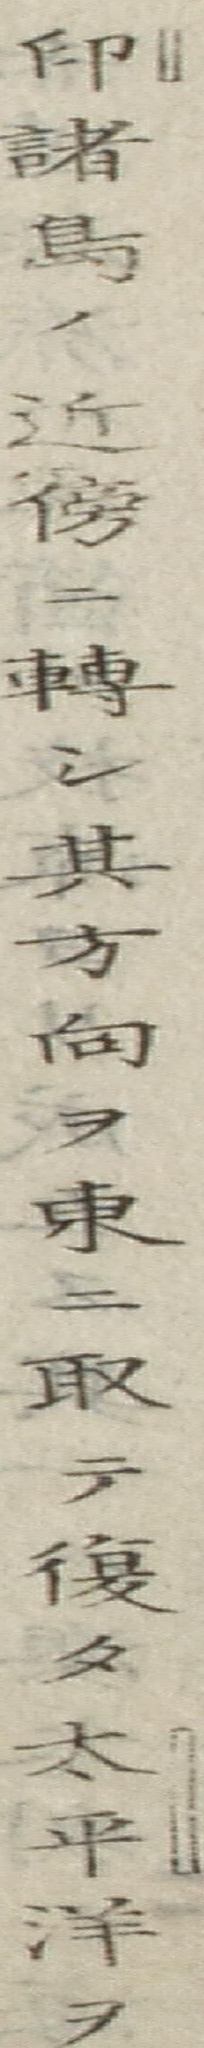印諸島ノ近傍ニ転シ其方向ヲ東ニ取テ復タ太平洋ヲ
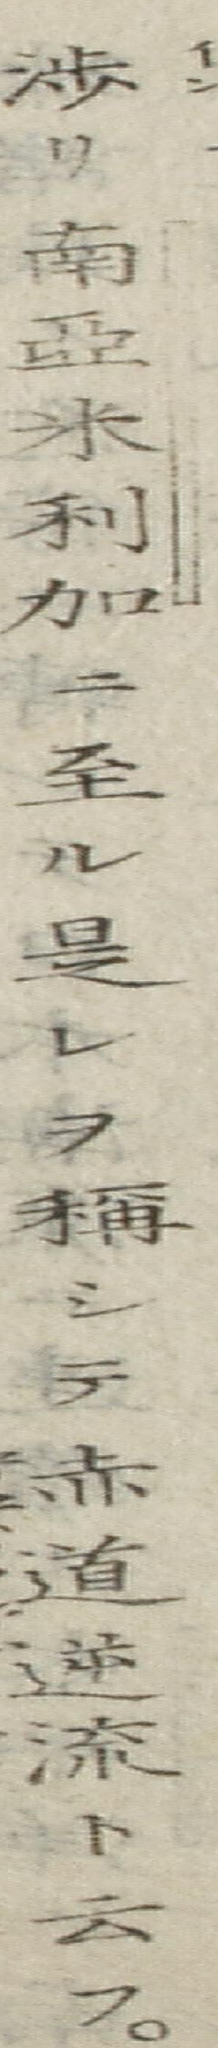渉リ南亜米利加ニ至ル是レヲ稍シテ赤道逆流ト云フ。
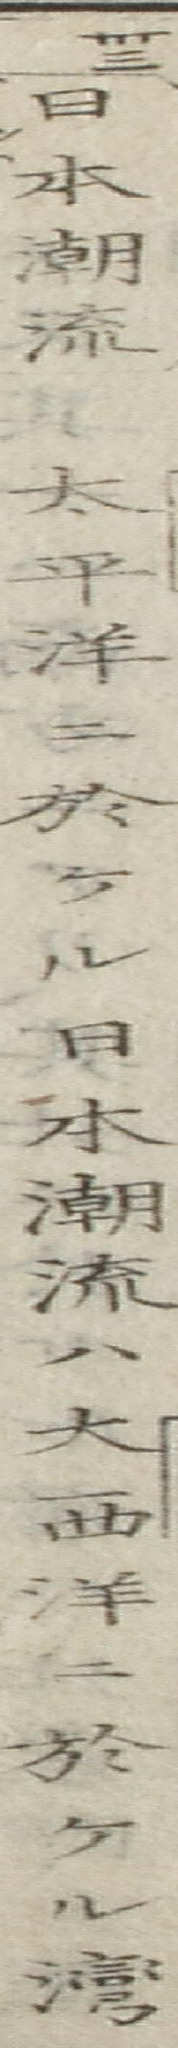卅三〔日本潮流〕太平洋ニ於ケル日本潮流ハ大西洋ニ於ケル湾
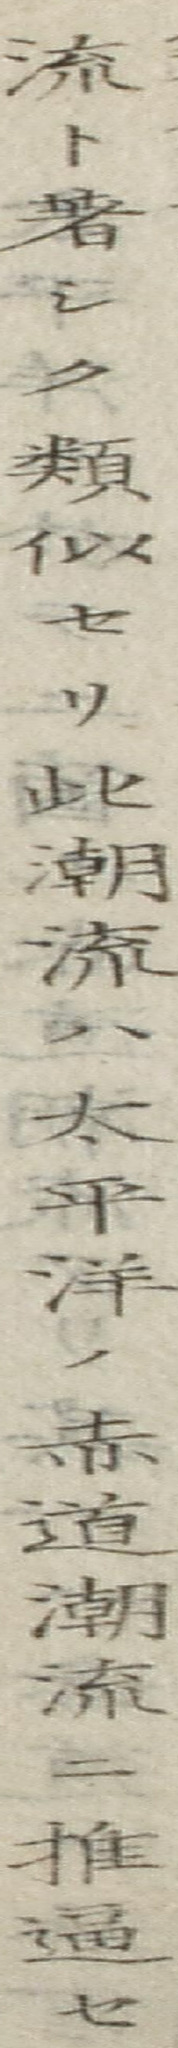流ト著シク類似セリ此潮流ハ太平洋ノ赤道潮流ニ推逼セ
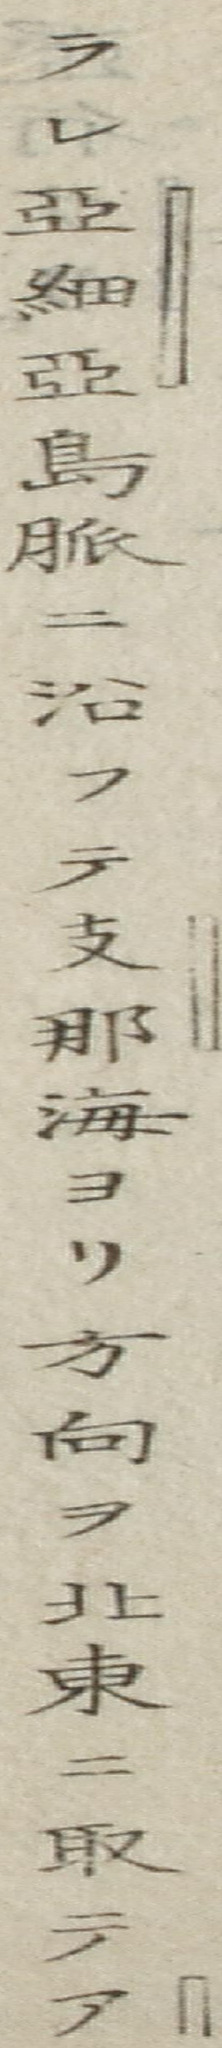ラレ亜細亜島脈ニ沿フテ支那海ヨリ方向ヲ北東ニ取テア
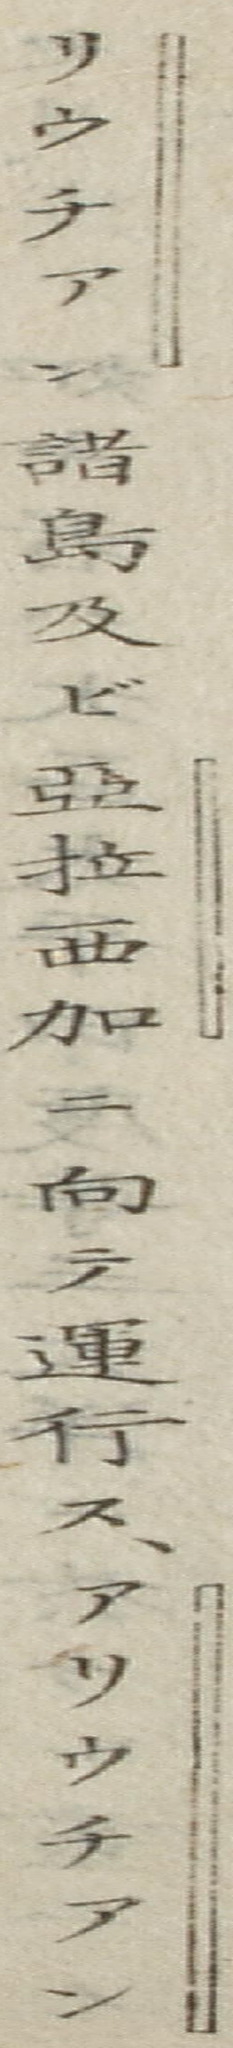リウチアン諸島及ビ亜拉西加ニ向テ運行ス、アリウチアン
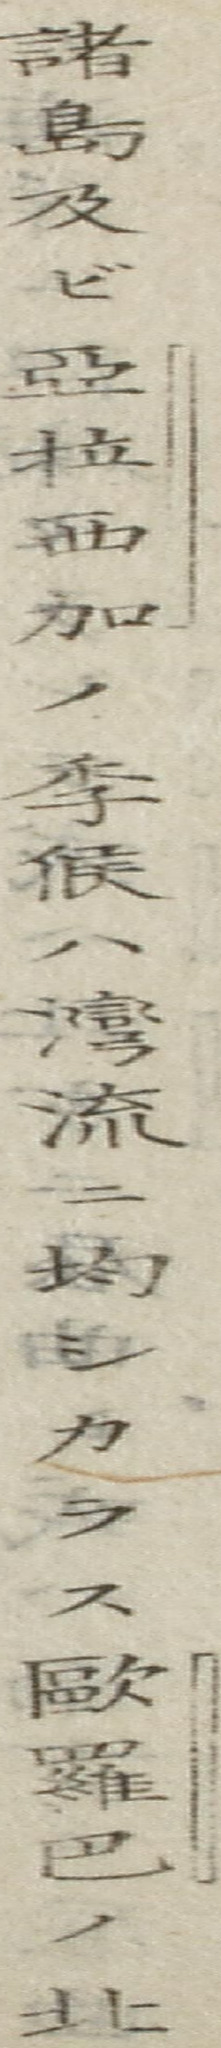諸島及ビ亜拉西加ノ季候ハ湾流ニ均シカラス欧羅巴ノ北
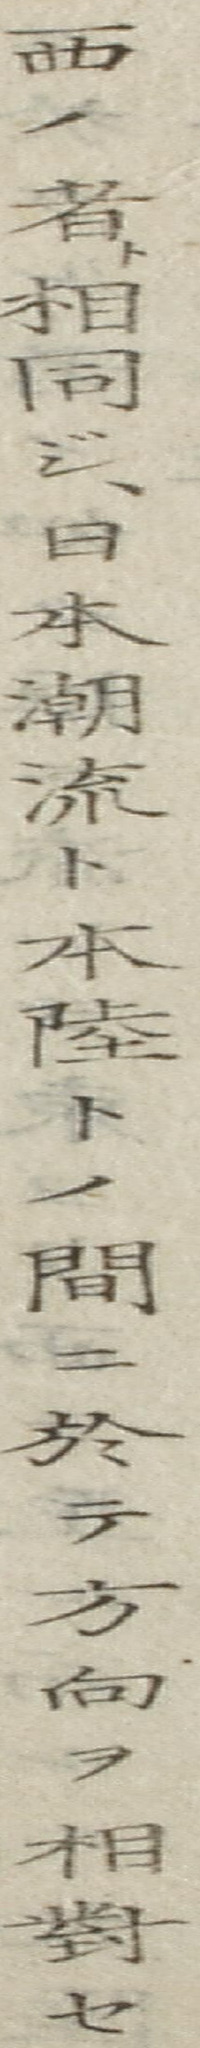西ノ者ト相同ジ、日本潮流ト本陸トノ間ニ於テ方向ヲ相対セ
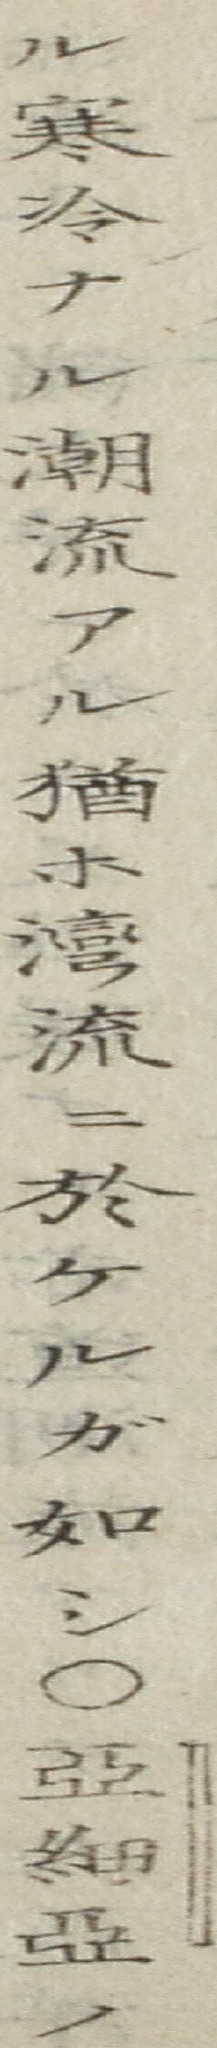ル寒冷ナル潮流アル猶ホ湾流ニ於ケルガ如シ○亜細亜ノ
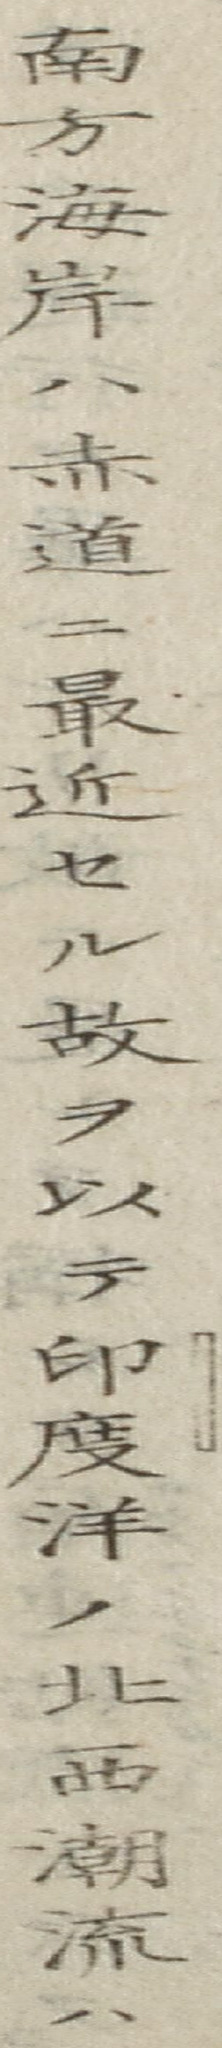南方海岸ハ赤道ニ最近セル故ヲ以テ印度洋ノ北西潮流ハ
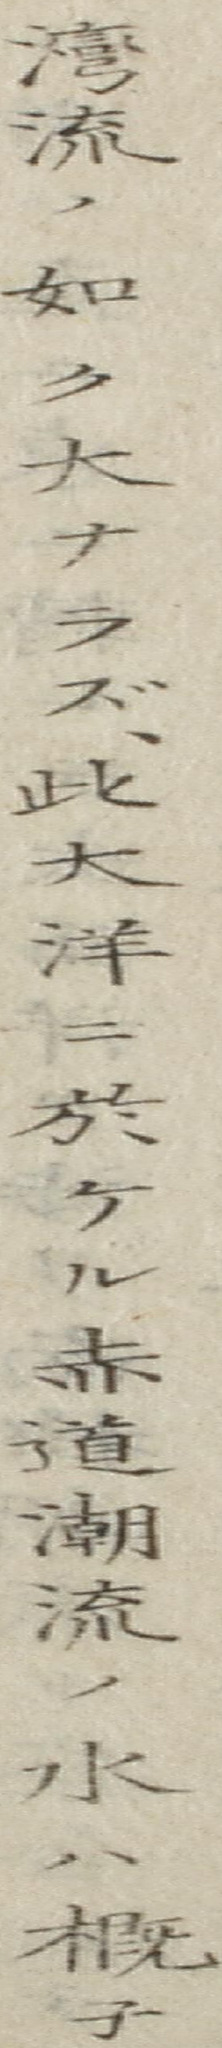湾流ノ如ク大ナラズ、此大洋ニ於ケル赤道潮流ノ水ハ概子
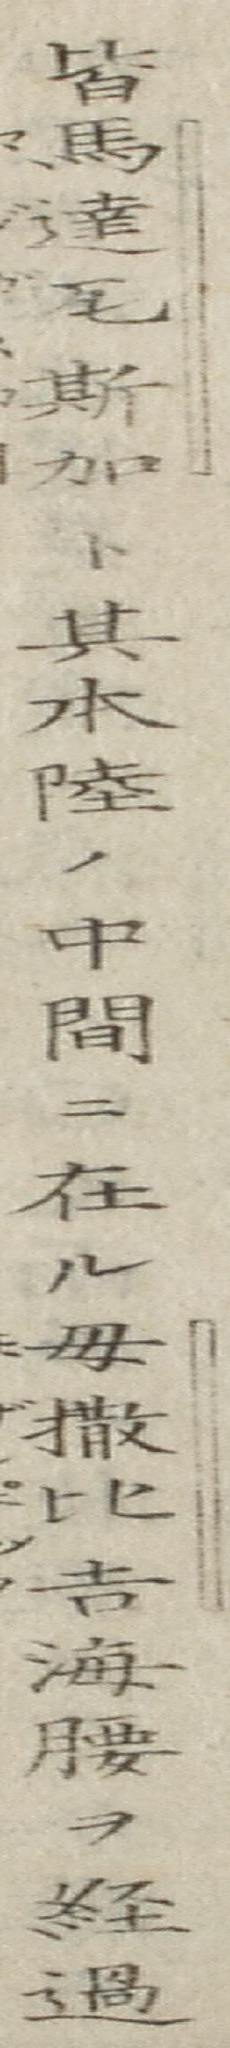皆馬達瓦斯加ト其本陸ノ中間ニ在ル母撒比吉海腰ヲ経過
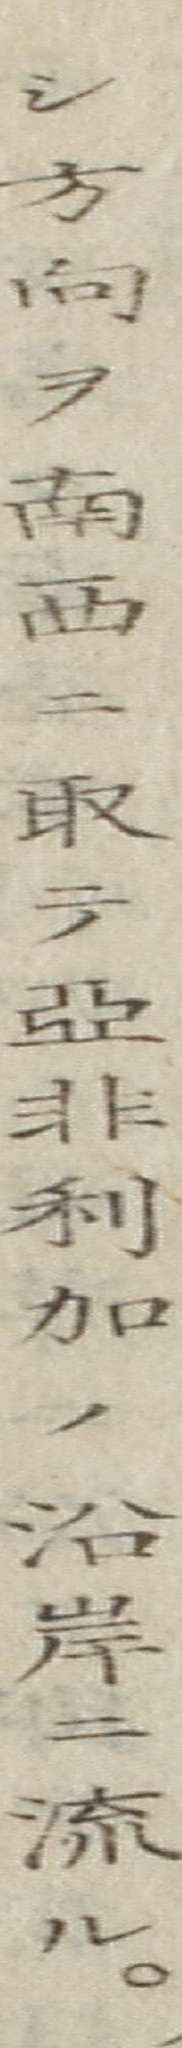シ方向ヲ南西ニ取テ亜非利加ノ沿岸ニ流ル。
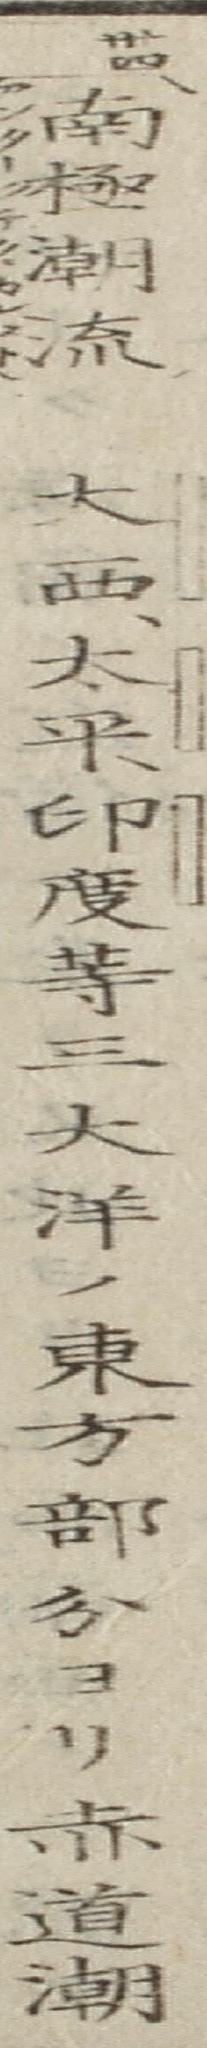卅四〔南極潮流〕大西、太平、印度等三大洋ノ東方部分ヨリ赤道潮
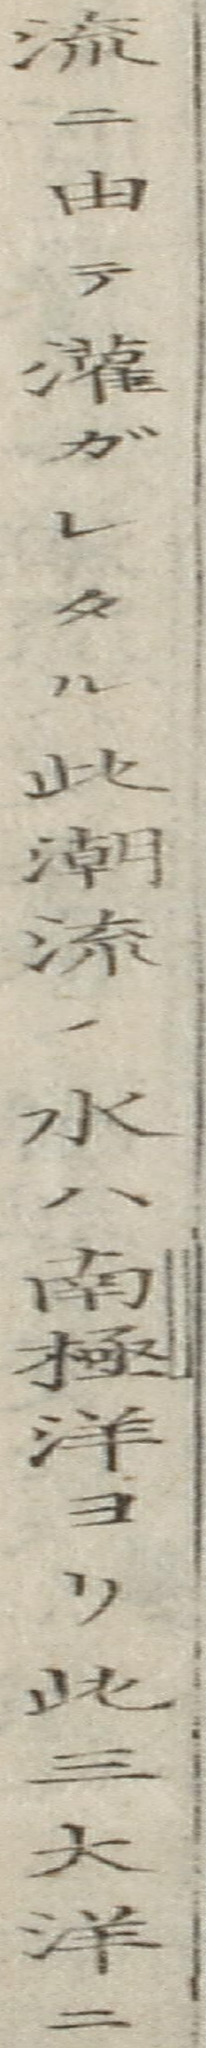流ニ由テ灌ガレタル此潮流ノ水ハ南極洋ヨリ此三大洋ニ
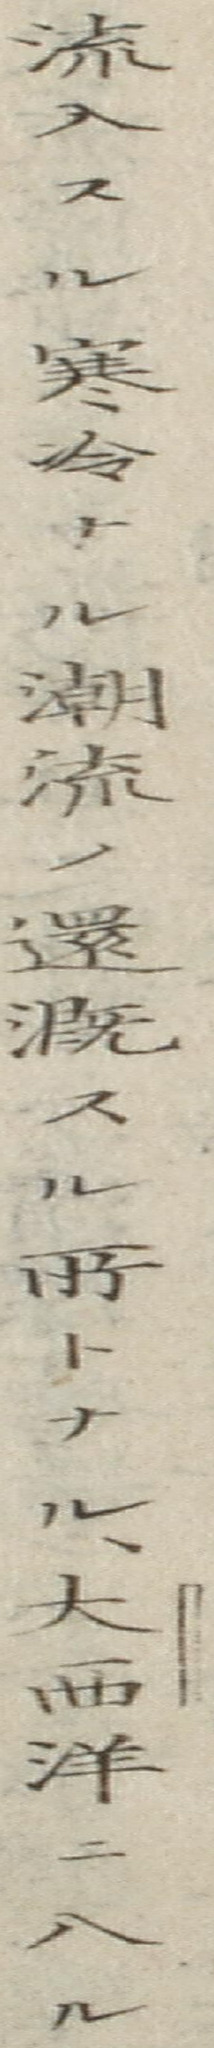流入スル寒冷ナル潮流ノ還漑スル所トナル、大西洋ニ入ル
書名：地形論　巻二
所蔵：東京大学地震研究所図書室 Earthquake Research Institute Library, The University of Tokyo, JAPAN
